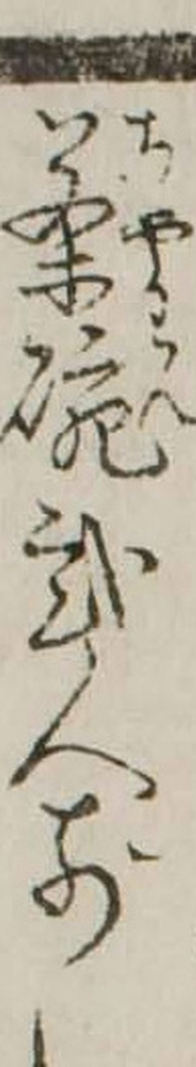茶碗弐人前
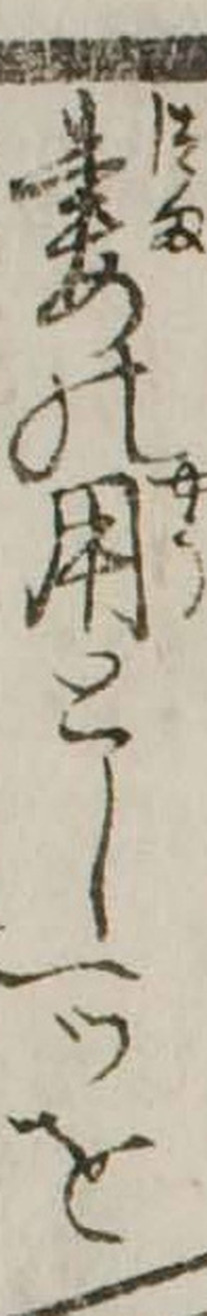妻の用とし一ッを
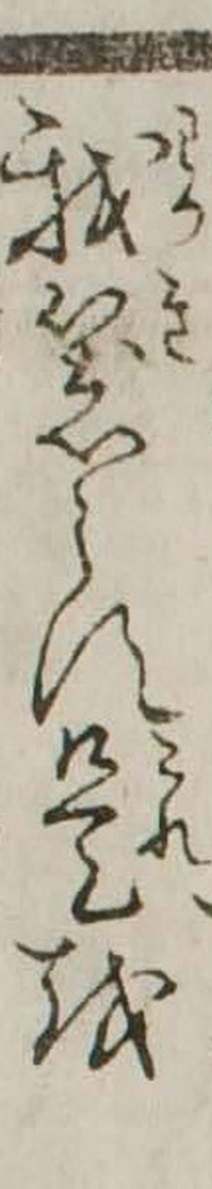我器とす是を
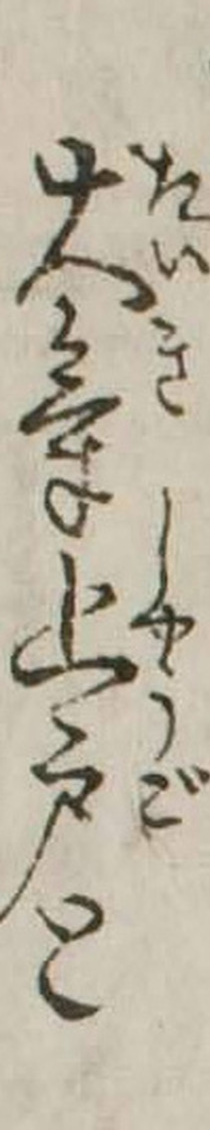大気上戸と
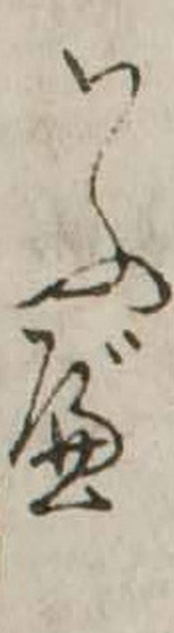いふべし

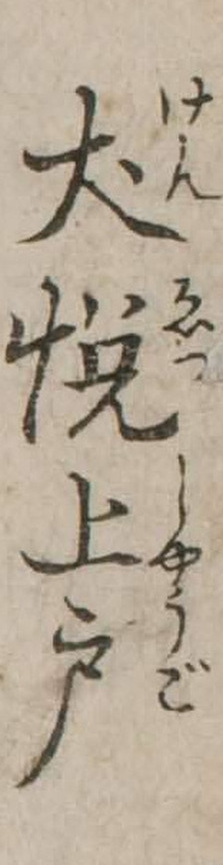犬悦上戸
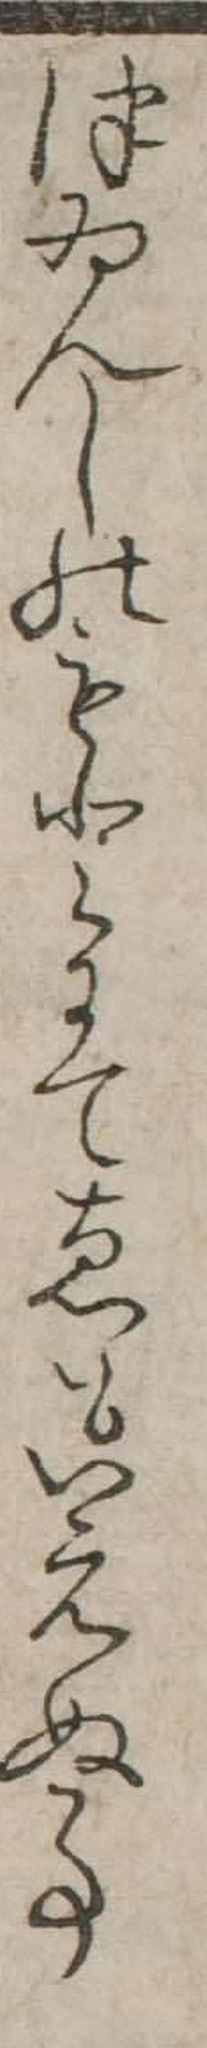つゐんしのもとにてゑもいえぬ事
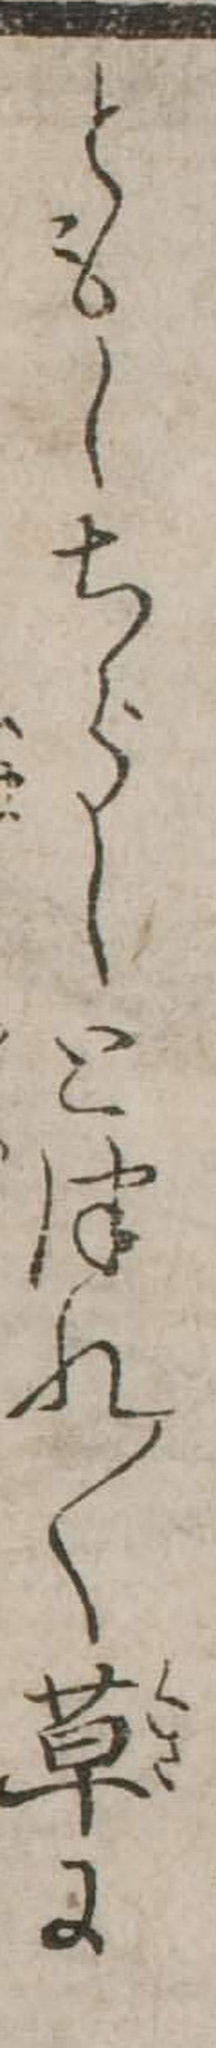ともしちらしとつれ〳〵草に
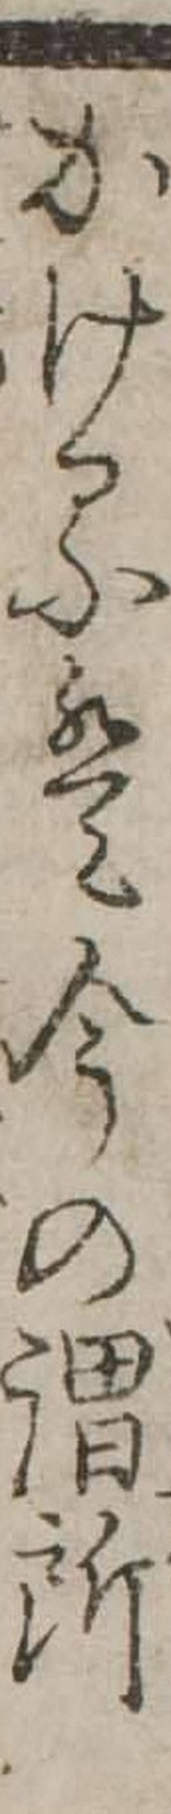かけるは今の謂所
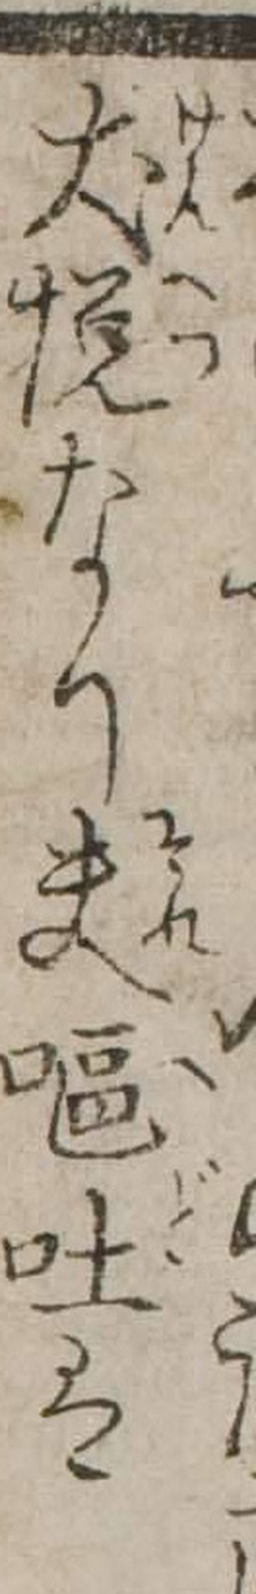犬悦なり夫嘔吐は
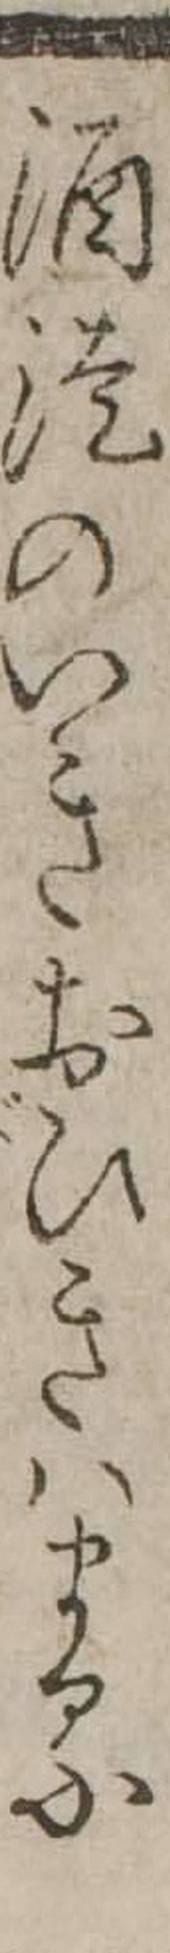酒徒のいきおひきはまる
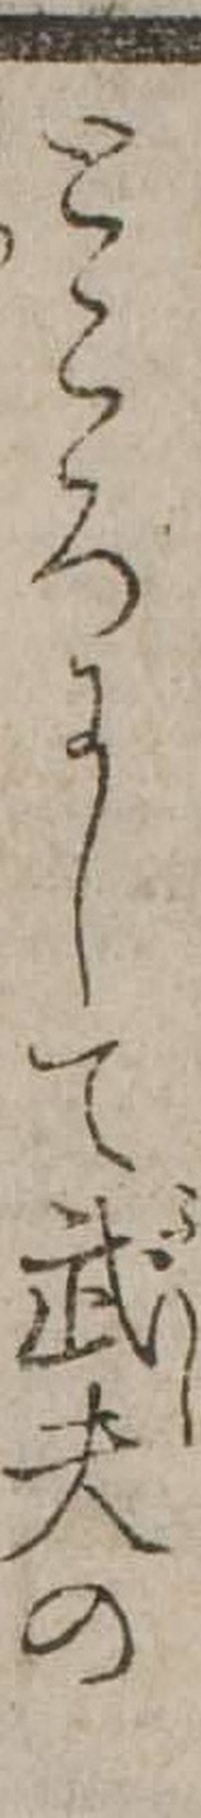ところにして武夫の
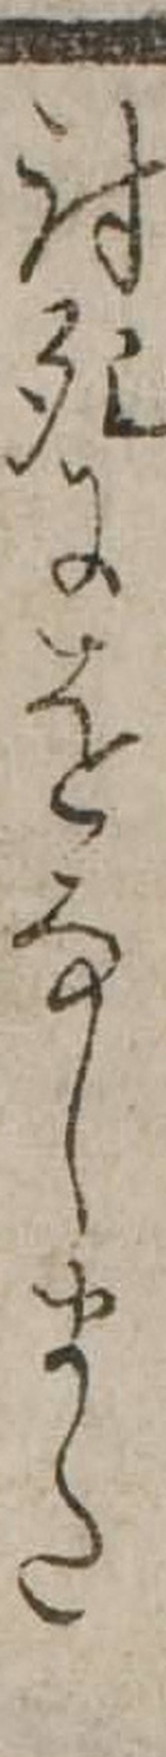討死にをなしまた
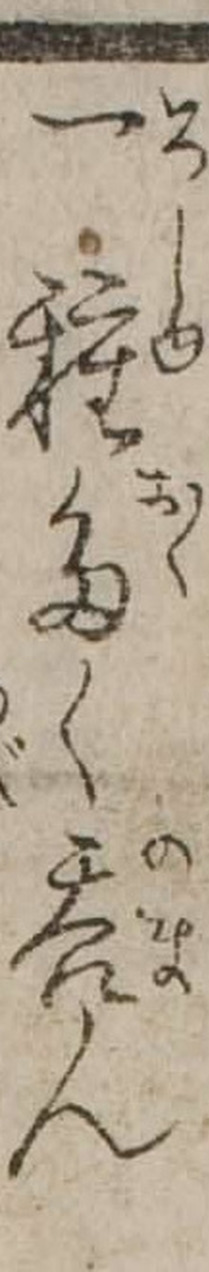一種多く呑ん
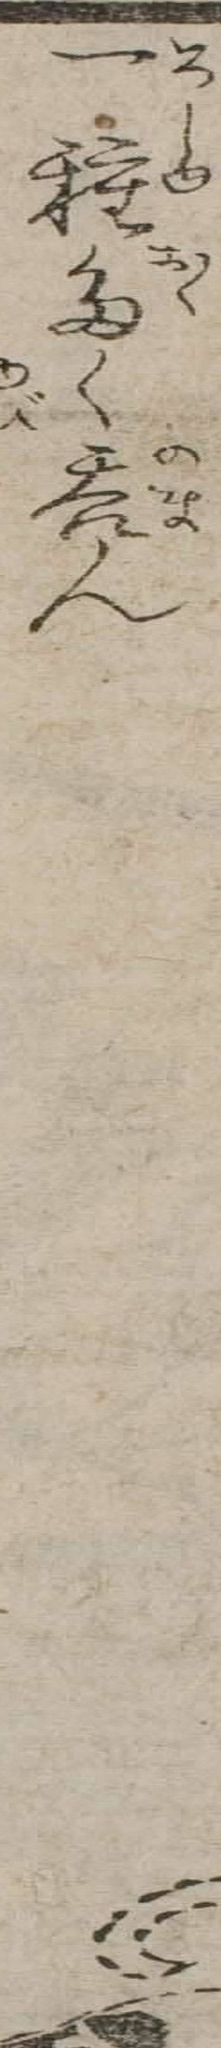一種多く呑ん
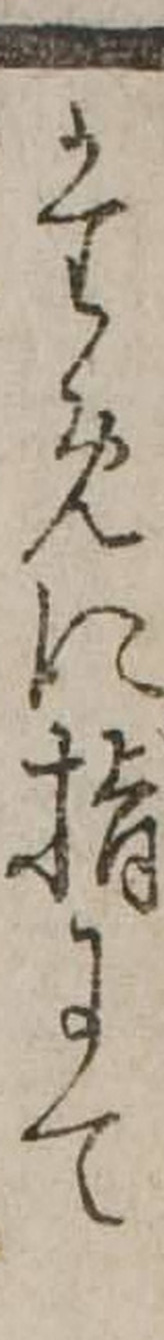ために指にて
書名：繪本不盡泉
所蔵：国文学研究資料館
